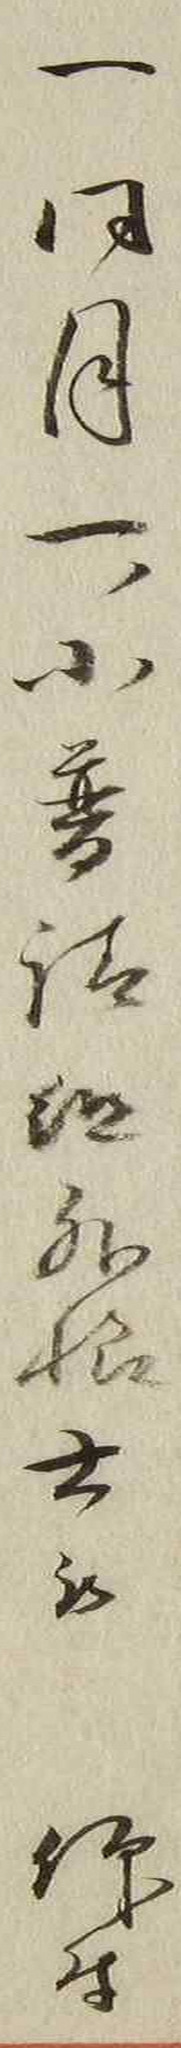一同月一ノ小普請組外様士被仰付
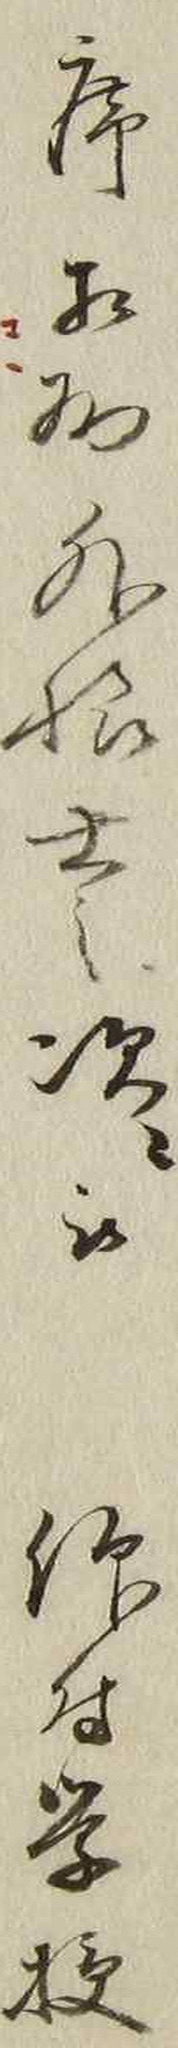席相州外様士之次ニ被仰付学校
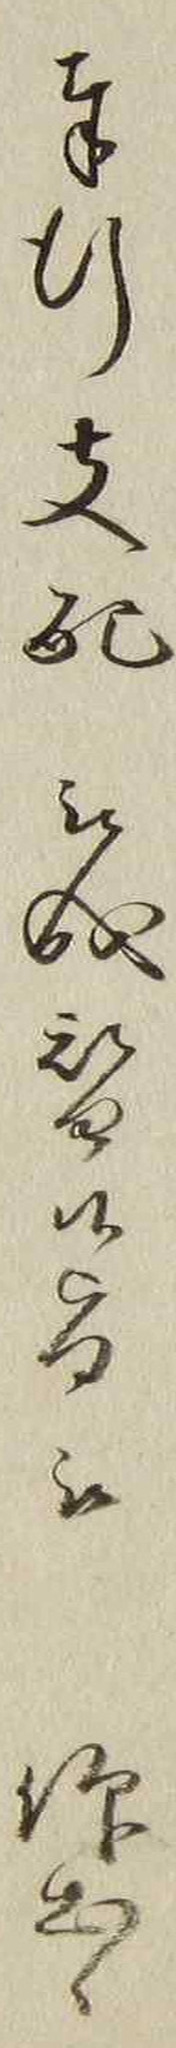奉行支配被成替候旨被仰出候
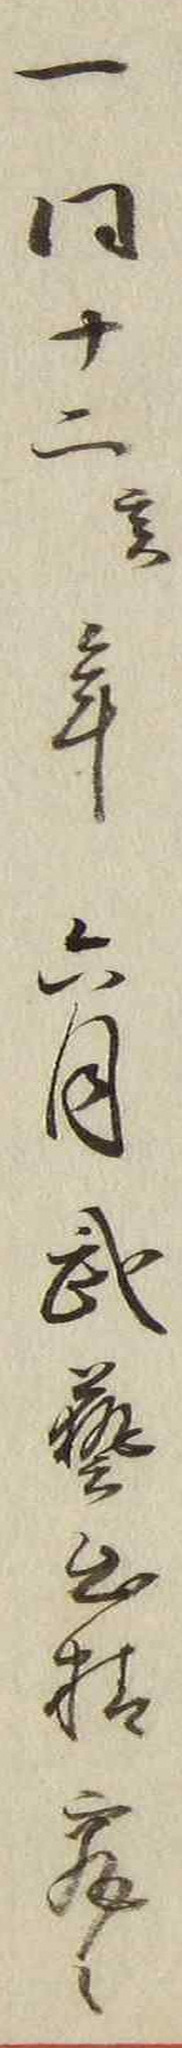一同十二亥年六月武芸出精究之

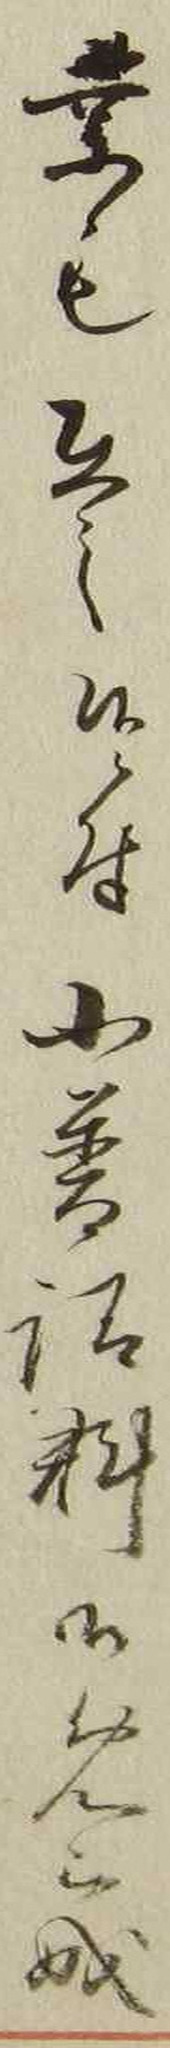業も在之候ニ付小普請料御免被成
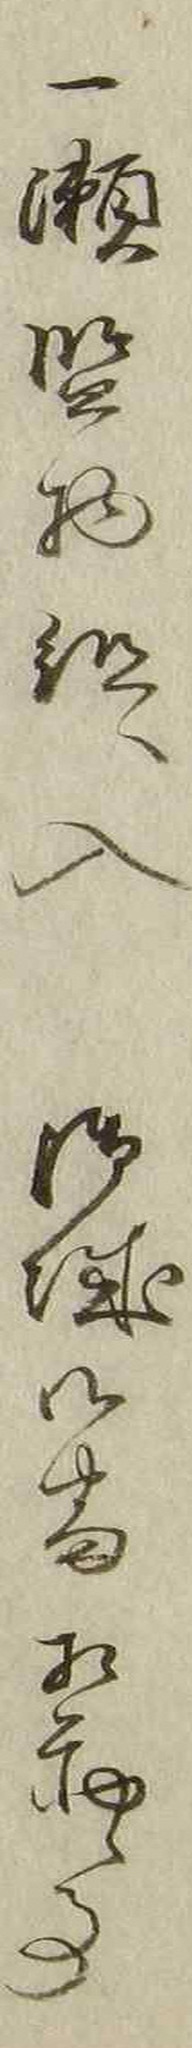一瀬監物組へ入御城御番相勤候事
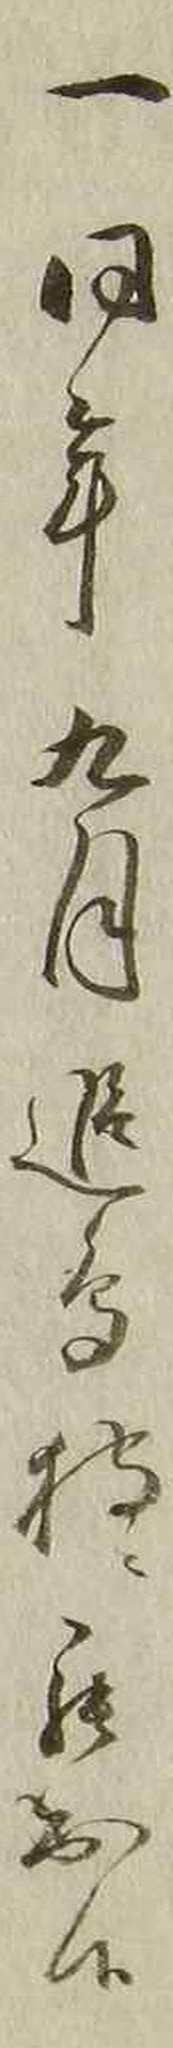一同年九月追鳥狩ニ罷出候
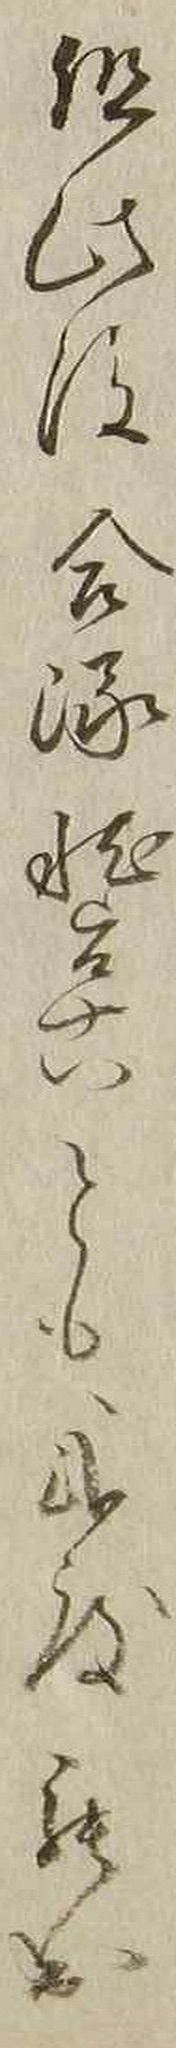但此後合隊稽古ともへ弐度罷出
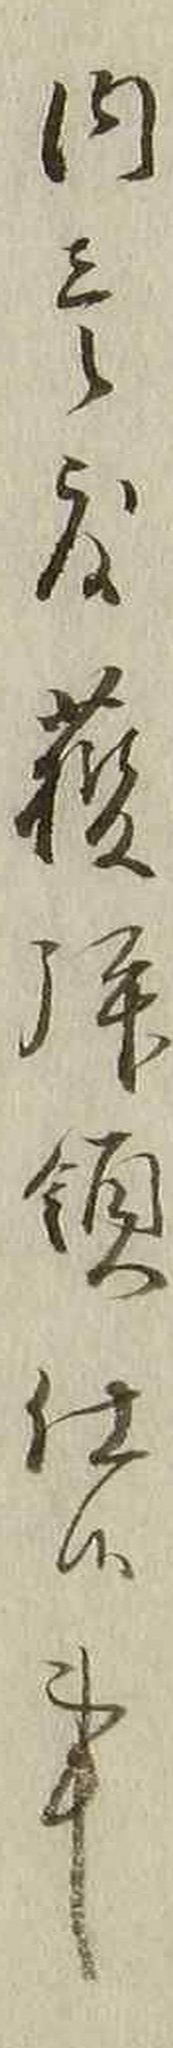内壱度獲拝領仕候事
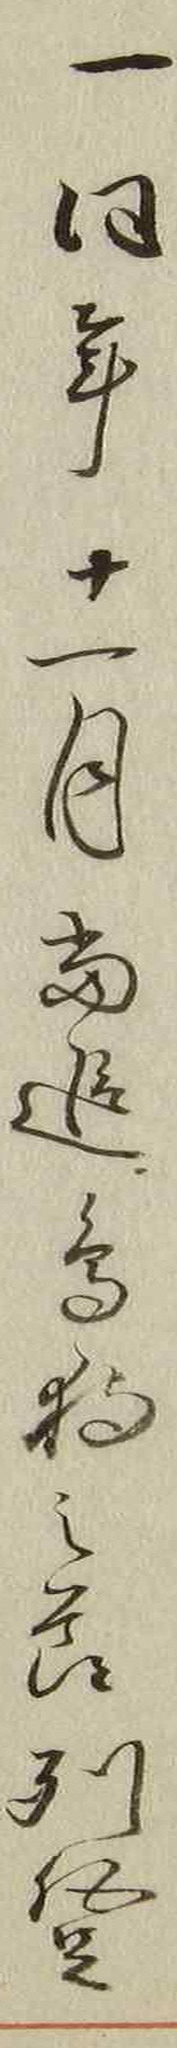一同年十一月当追鳥狩之節列伍足
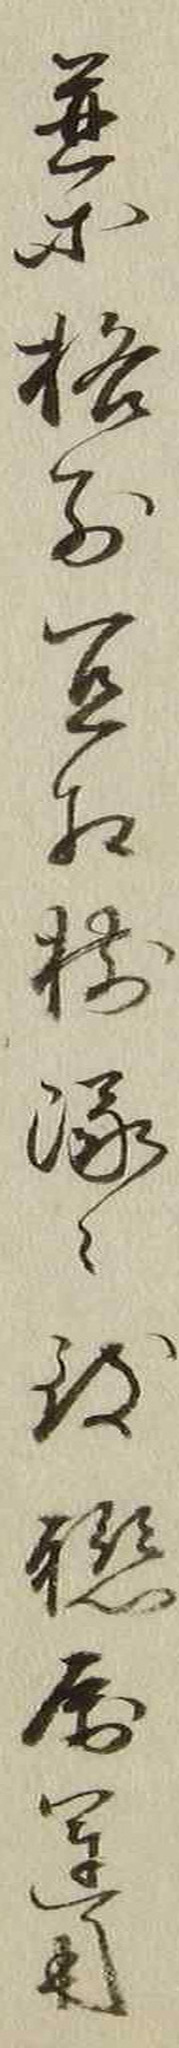並等格別宜相揃隊々致聯属運用
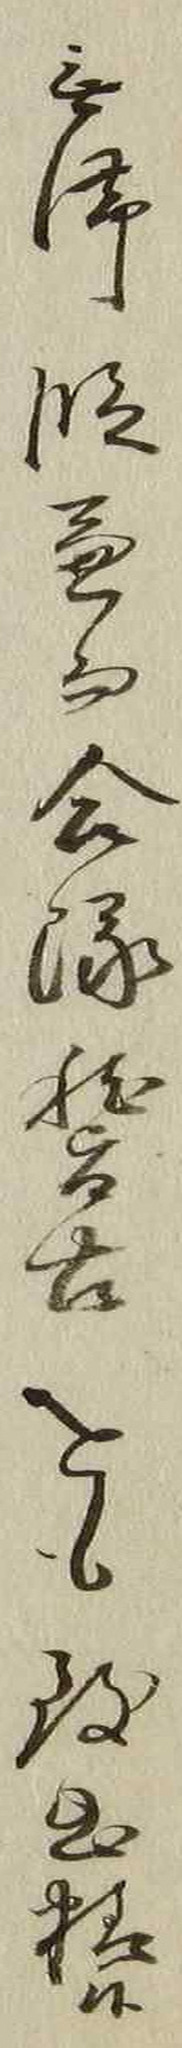無滞段兼而合隊稽古をも致出精候
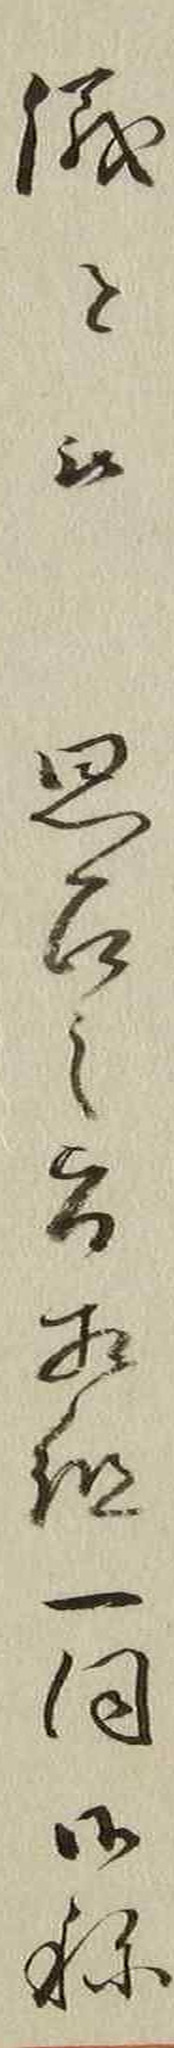儀と被思召之旨相組一同御称
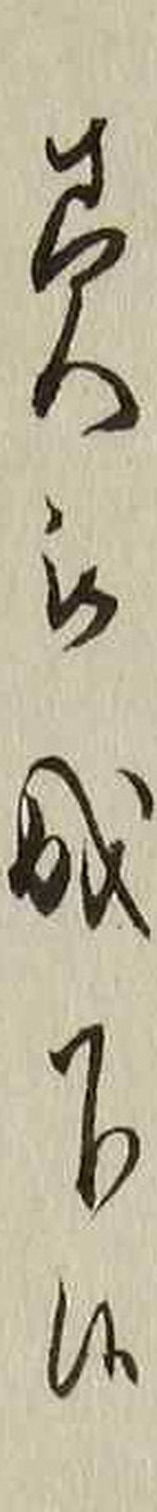美被成下候
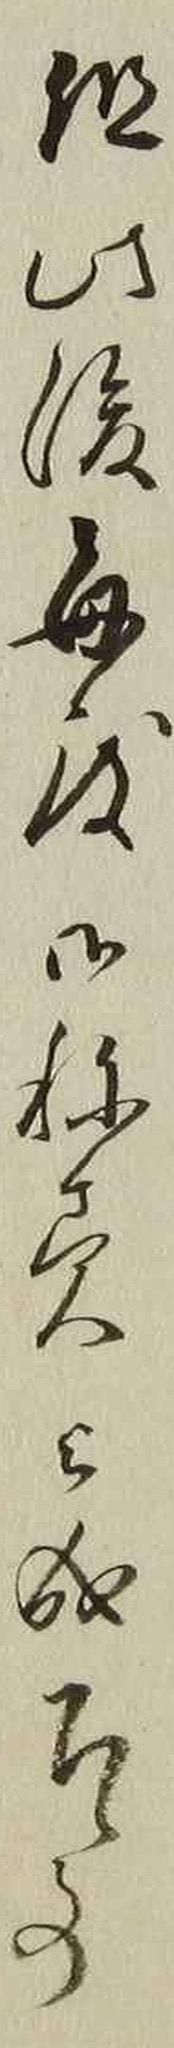但此後毎度御称美被成下候事
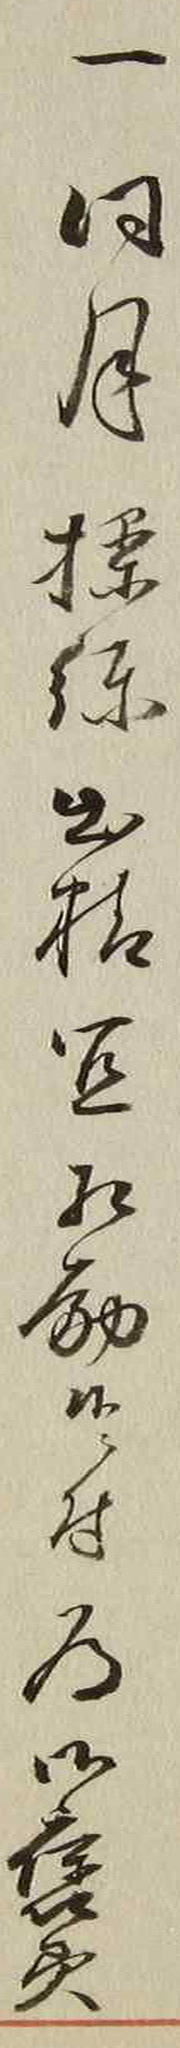一同月操練出精宜相励候ニ付為御褒美
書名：諸士系譜　巻之28　い之部28
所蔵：会津若松市立会津図書館
